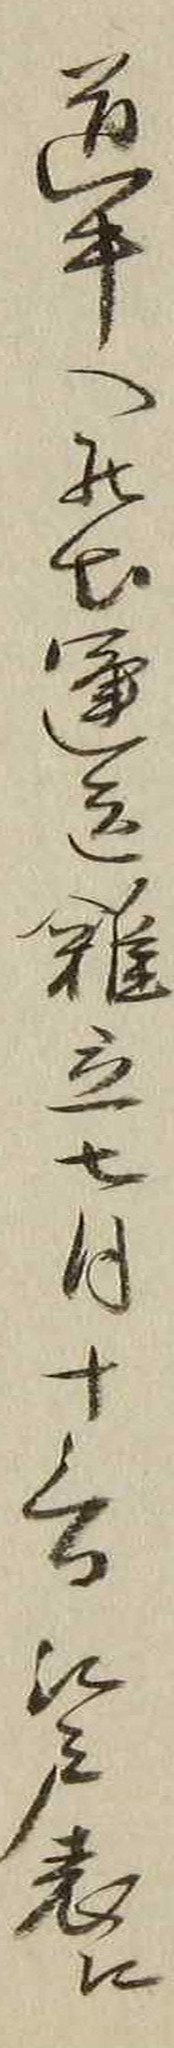道中へ罷出運送雑立七月十三日江戸表江
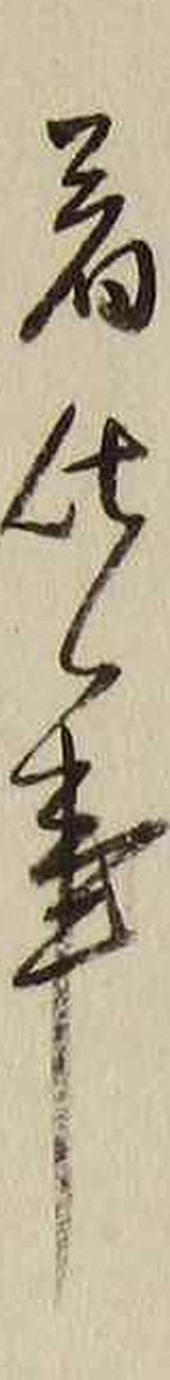着仕候事
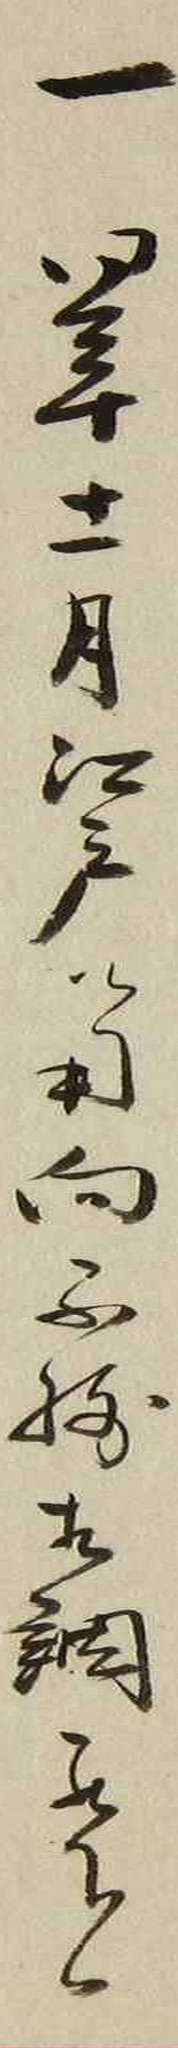一同年十一月江戸御用向不勝相調罷下候
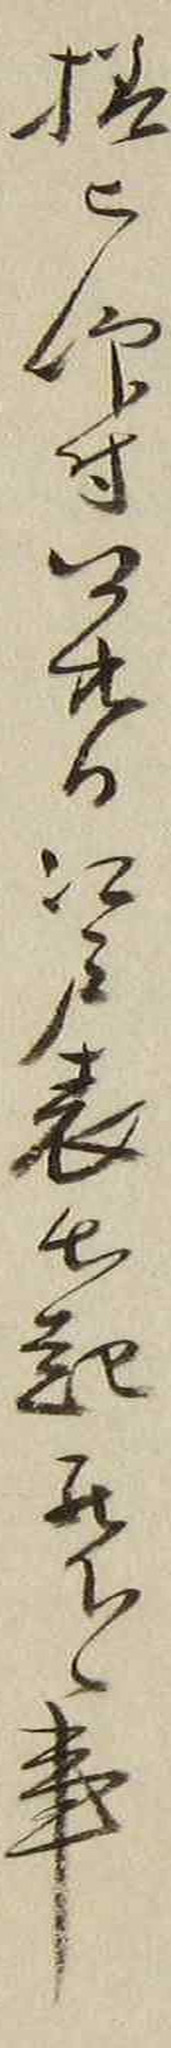様被仰付候廿日江戸表出起罷下候事
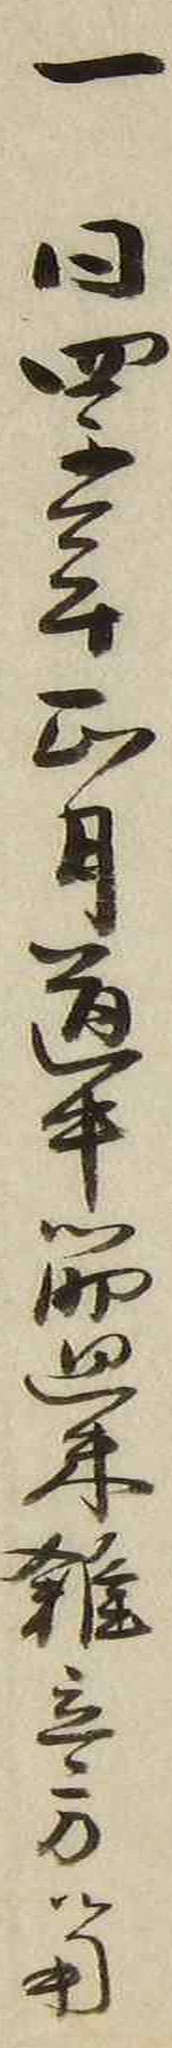一同四子年正月道中筋廻米雑立方御用
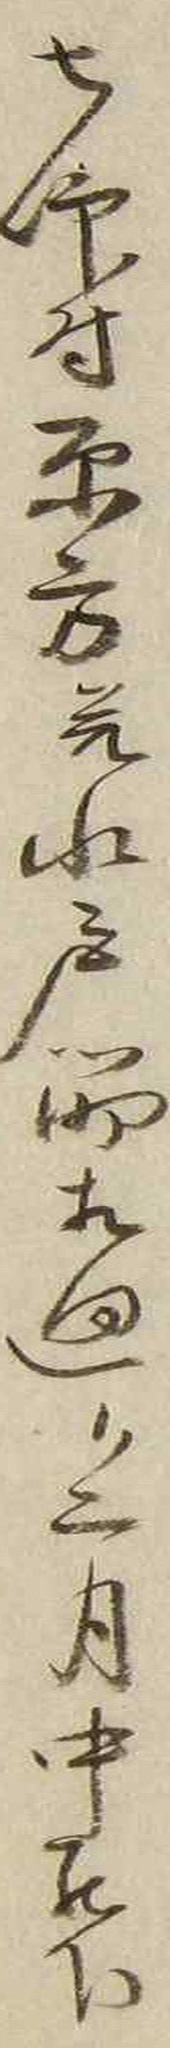被仰付原方并水戸筋相廻り二月中罷下

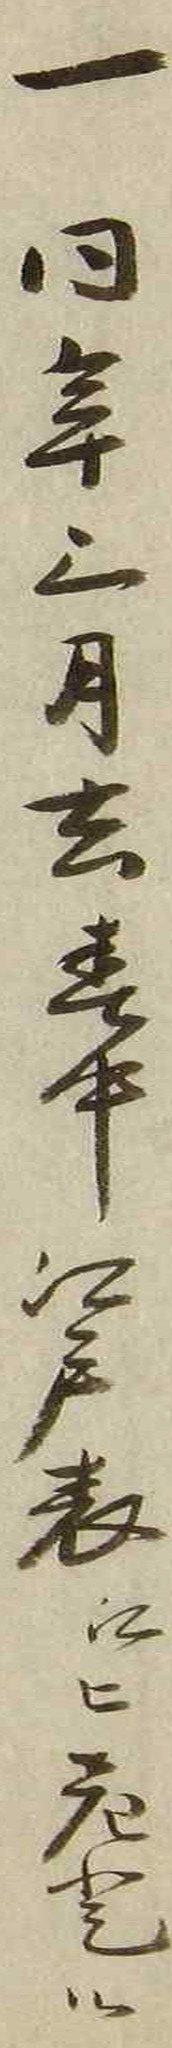一同年三月去春中江戸表江被差登候
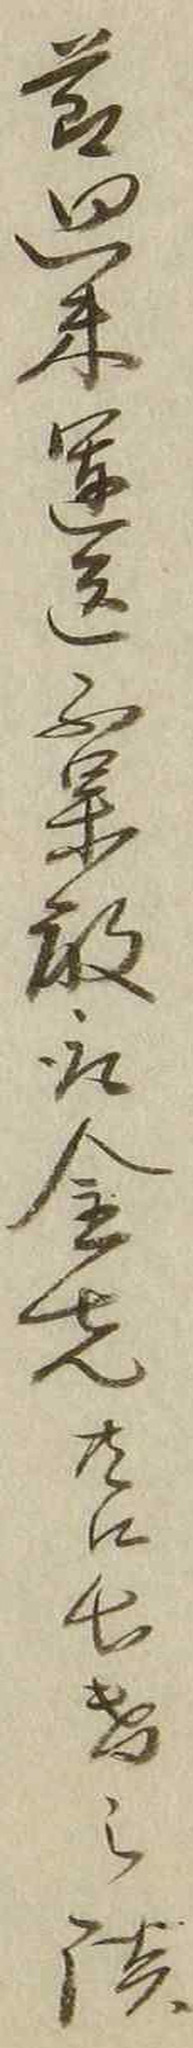節廻米運送不果敢取金先共江出替之談
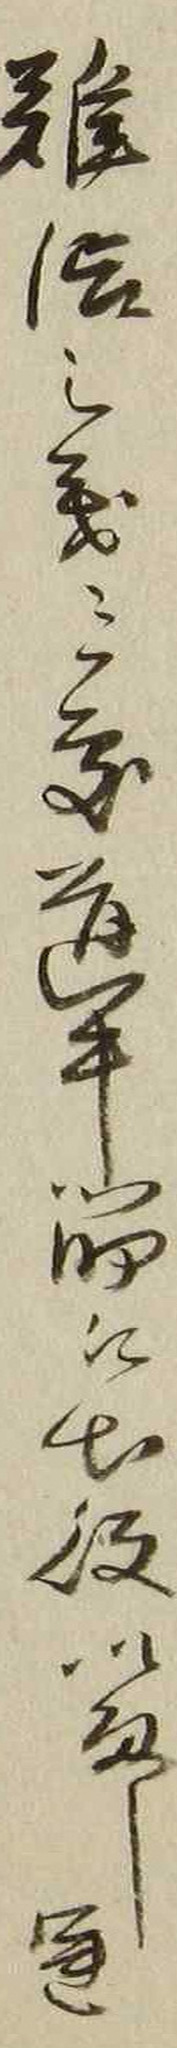難渋之義ニ候処道中筋江出役いたし運
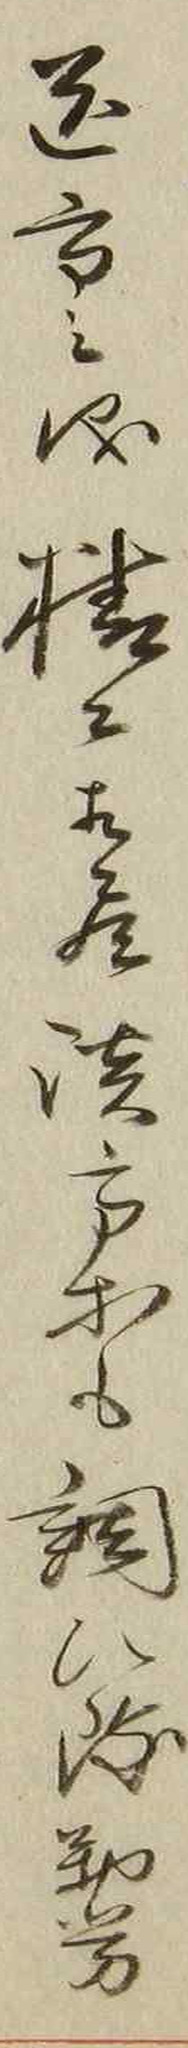送方之儀精々相尽談方等も調ひ致勤労
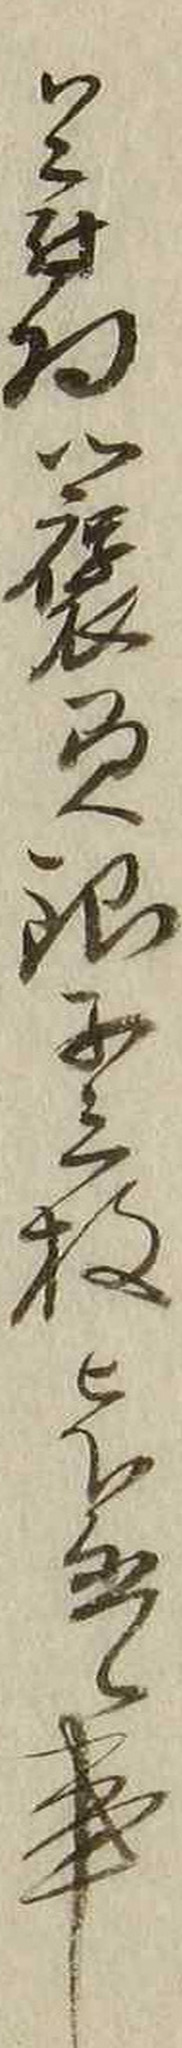候ニ付為御褒美銀子三枚被下置候事
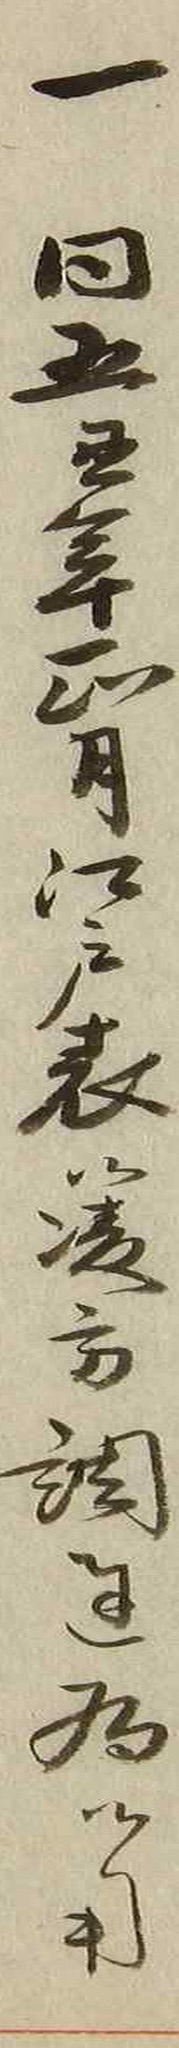一同五丑年正月江戸表御凌方調達為御用
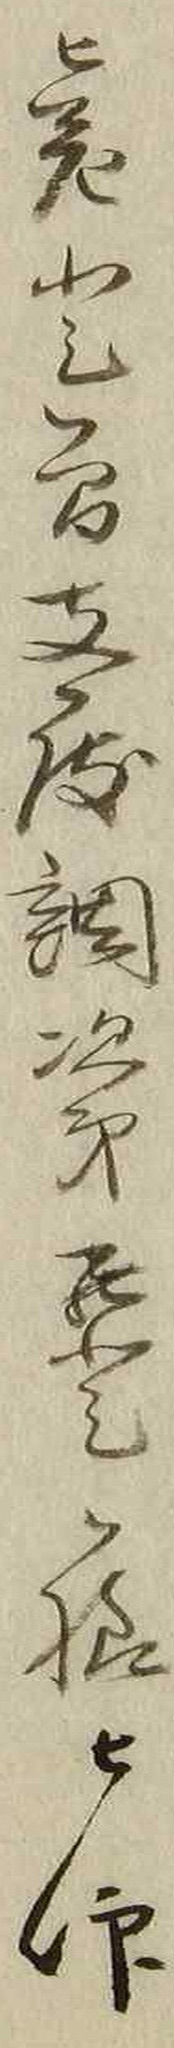被差登候間支度調次第罷登候様被仰
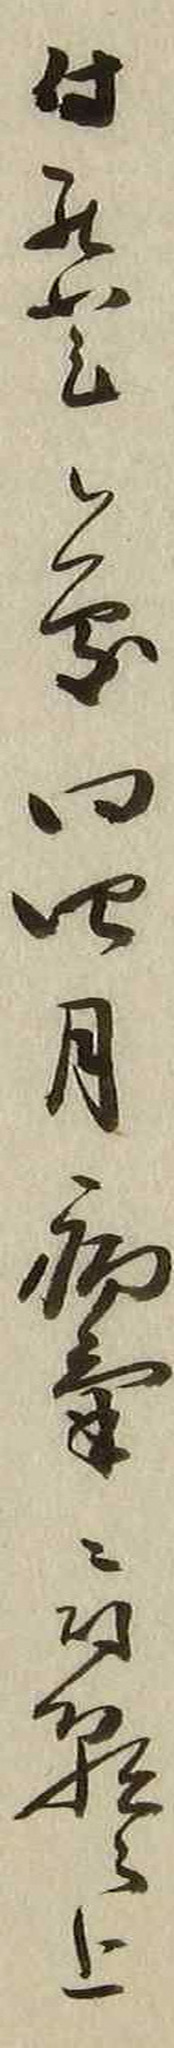付罷登候処同四月病気ニ付願之上
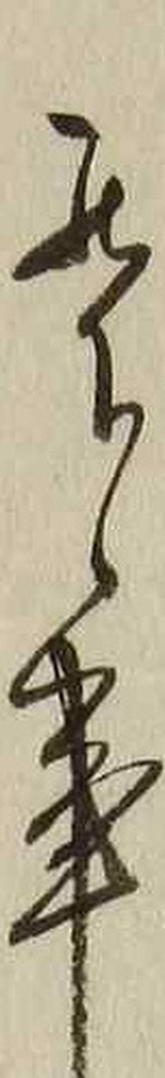罷下候事
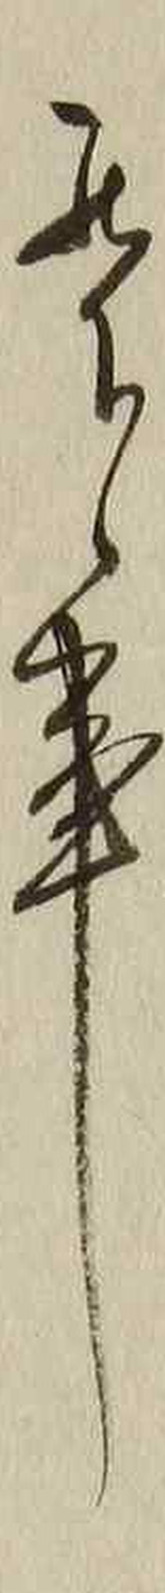罷下候事
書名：諸士系譜　巻之311　し之部1
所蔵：会津若松市立会津図書館
